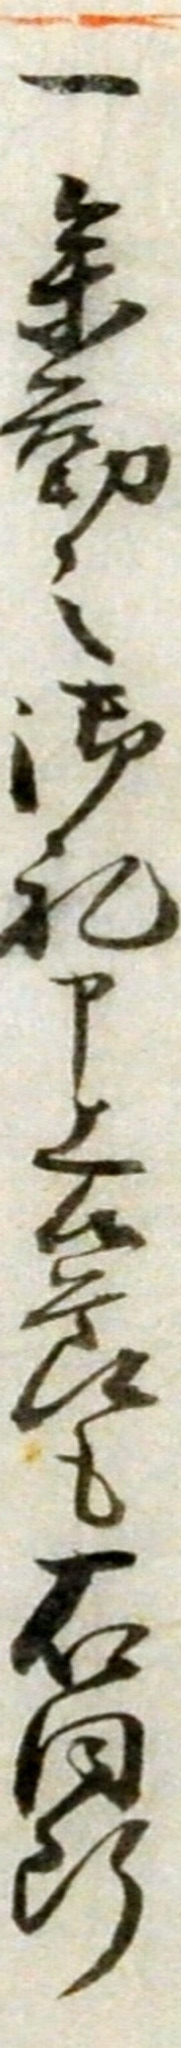一参勤之御礼申上候節も右同断
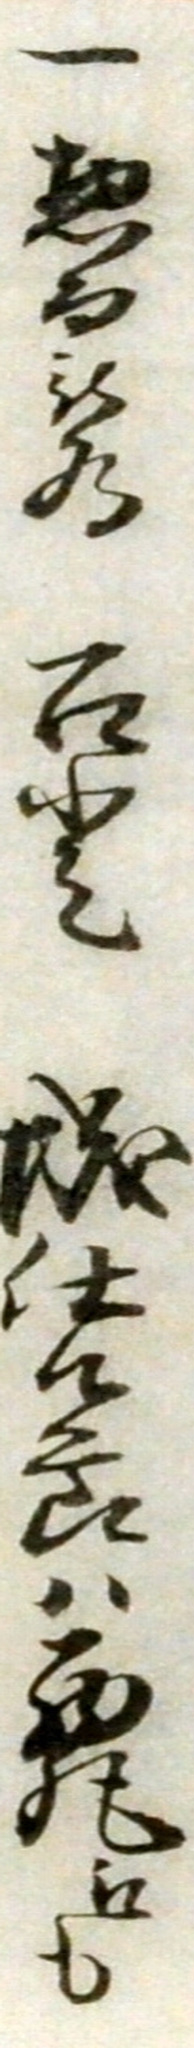一惣て被為召登城仕候節は西丸えも
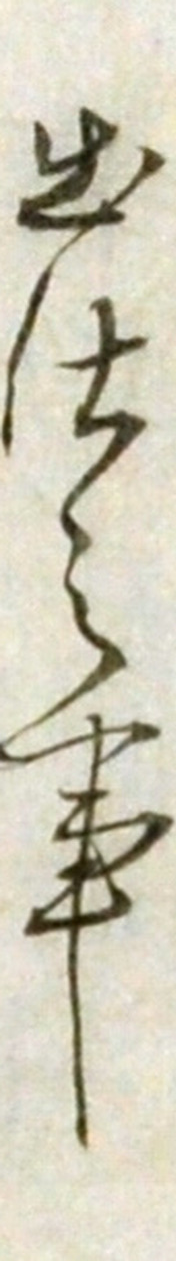出仕之事

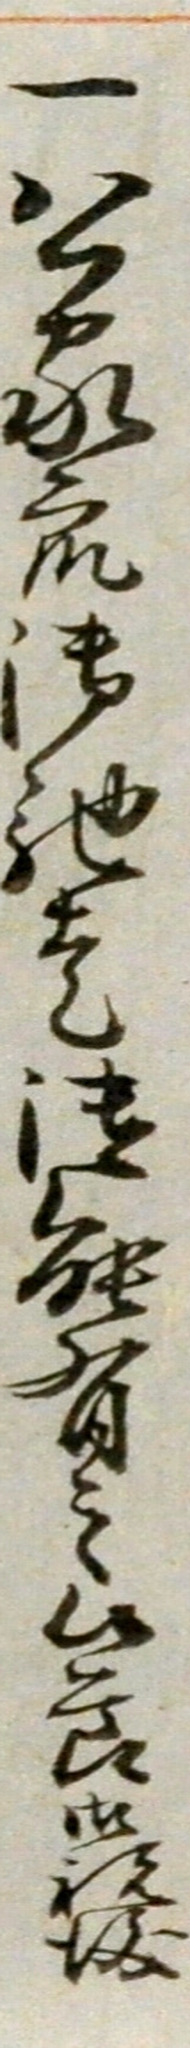一公家衆御馳走御能有之候節御祝儀
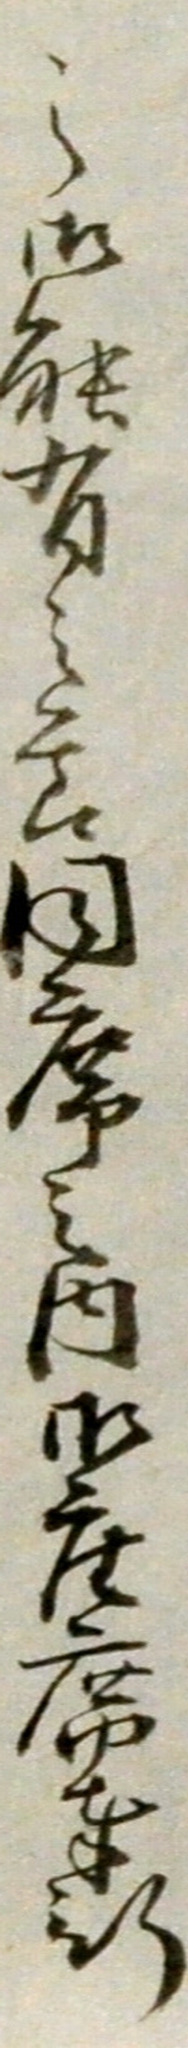之御能有之節同席之内御座席奉行
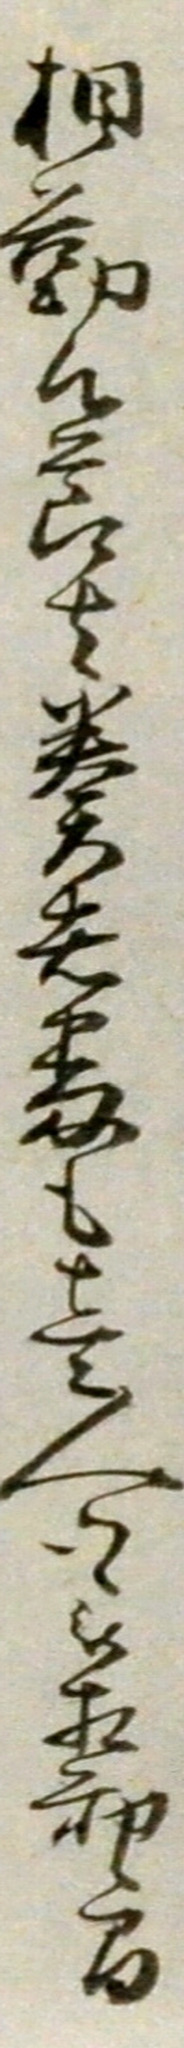相勤候節は奏者番も壱人ツヽ被相勤候間
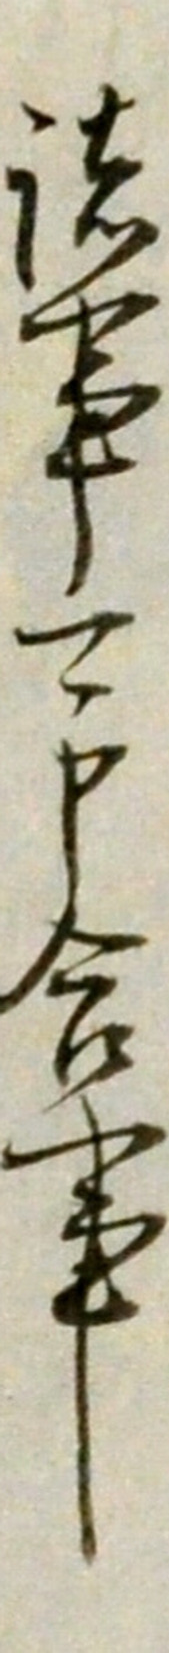諸事可申合事
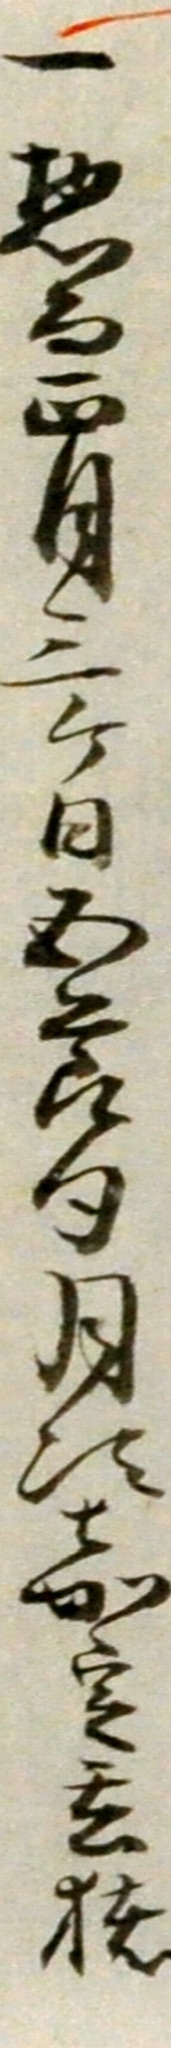一惣て正月三ヶ日五節句月次嘉定玄猪
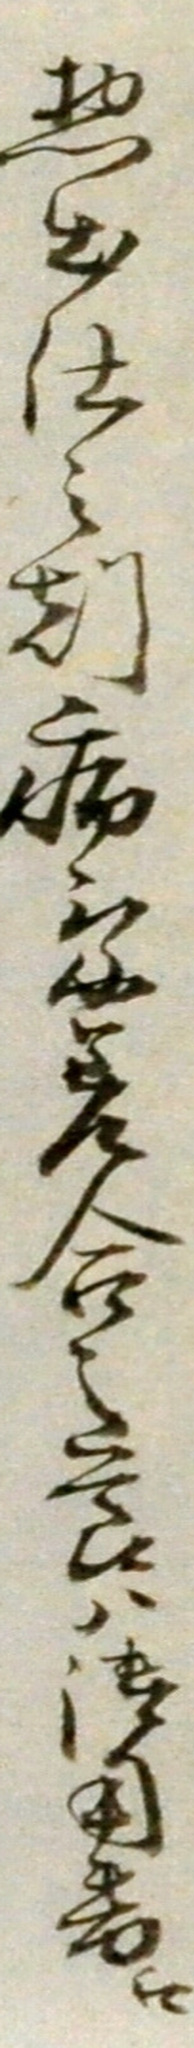惣出仕之刻病気差合之節は御用番え
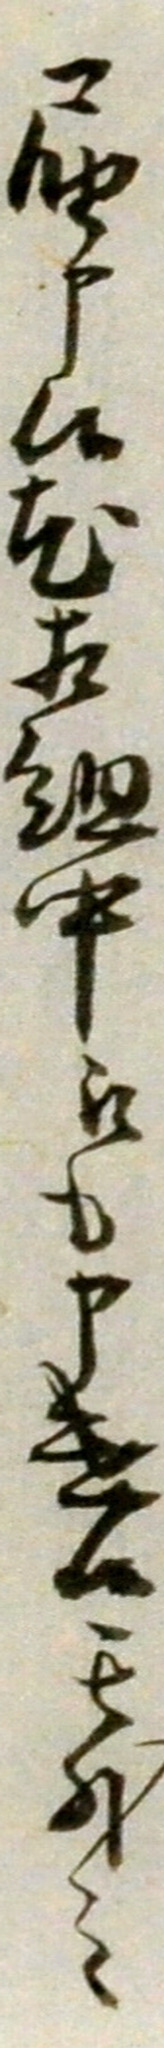届申候尤相組中えも申遣候其外之
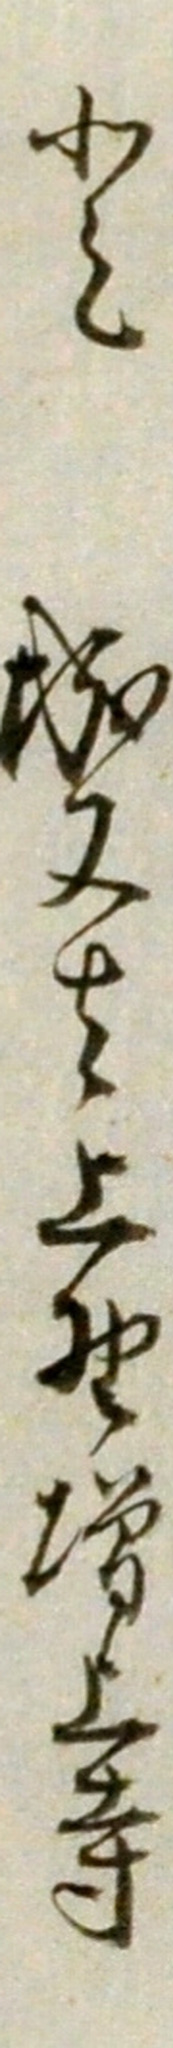登城又は上野増上寺
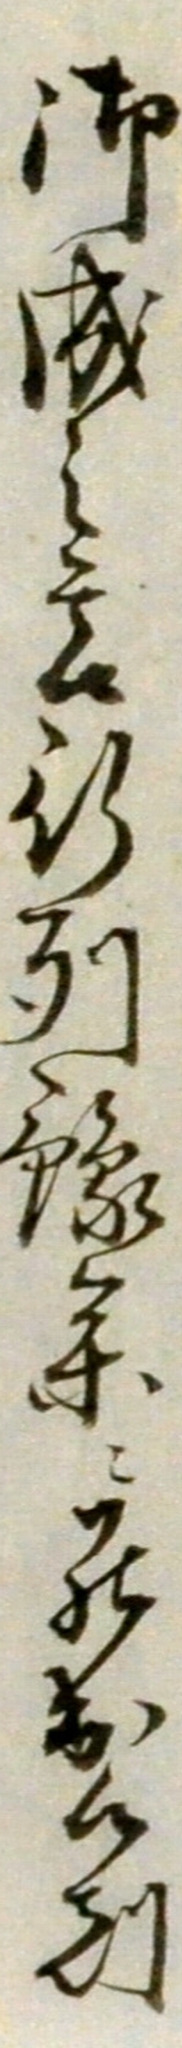御成之節行列余参に罷出候刻
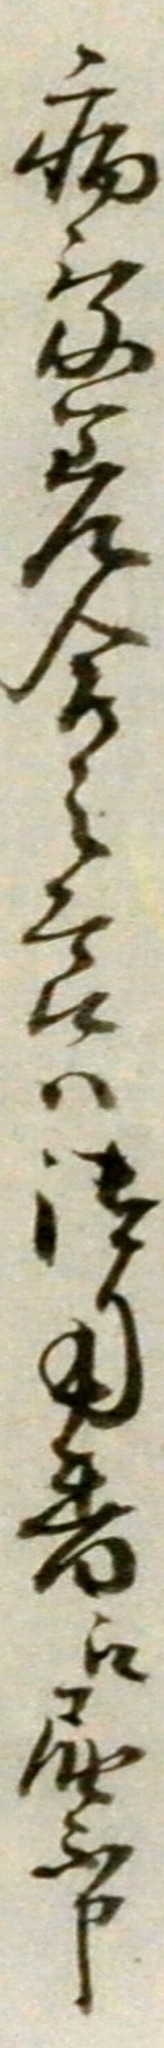病気差合之節は御用番え届不申
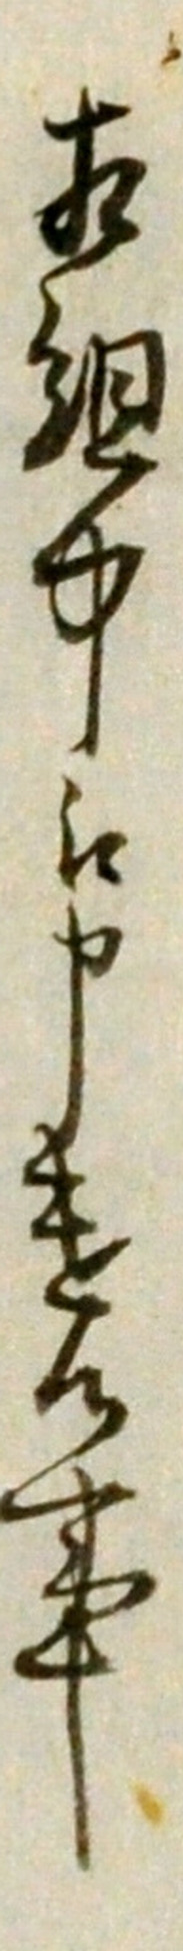相組中え申遣候事
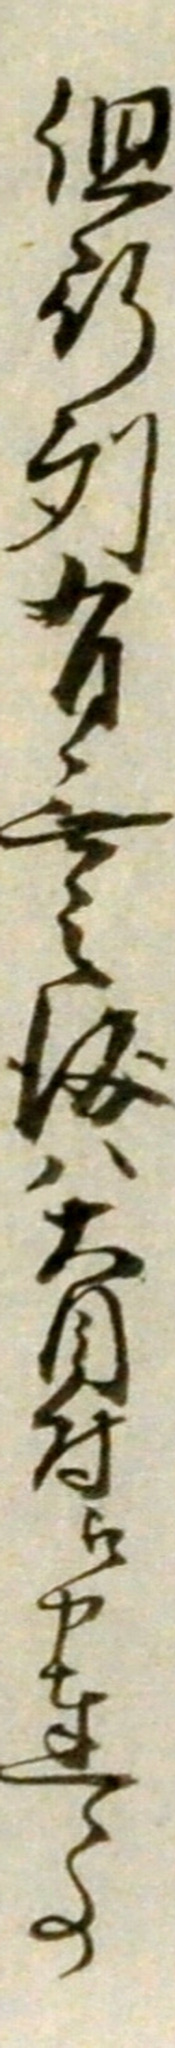但行列有無之儀は大目付え申達候事
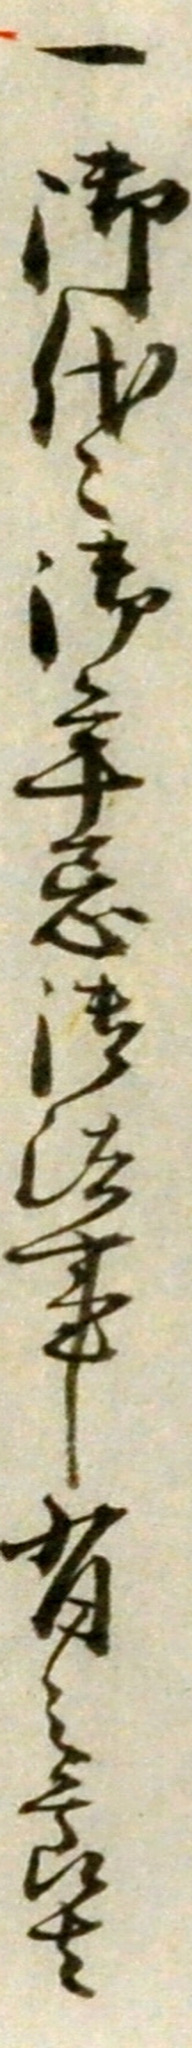一御代々御年忌御法事有之節は
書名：申合帳〔一括〕
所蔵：伊那市立高遠町図書館・合同会社AMANE
